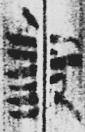寺（待）
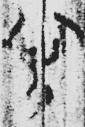兌（悅）
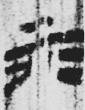而
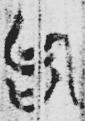句（後）
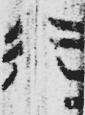行
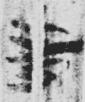寺（待）
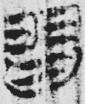習
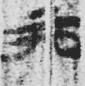而
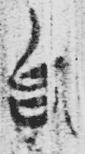句（後）
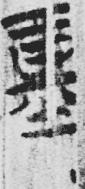○（奠）
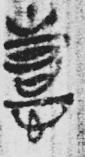憙（喜）
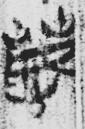○（怒）
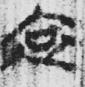哀
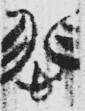悲
